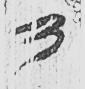乃
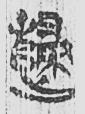歸
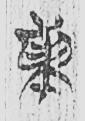{木𦥑}
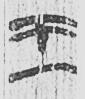王
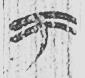于
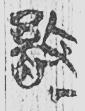{育攴}
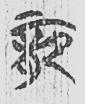龍
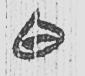白
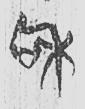和
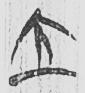立
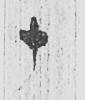十
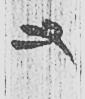又
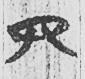四
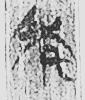年
